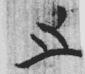之
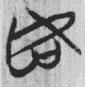如
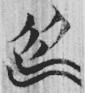從（從）
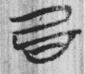○（己）
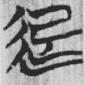○（起）
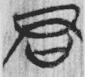君
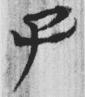子
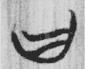曰
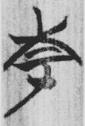考（孝）
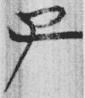子
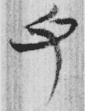父
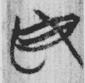母（母）
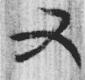又（有）
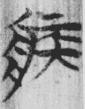疾
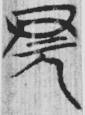○（冠）
